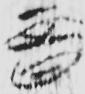音
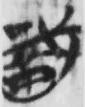戠
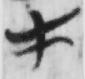牛
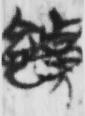饋
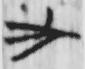之
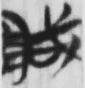戕
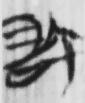敢
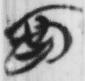爲
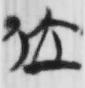位
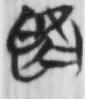既
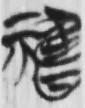禱
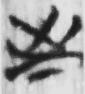至（致）
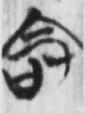命
